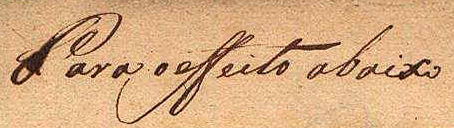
Para o effeito abaixo
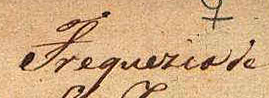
Freguezia de
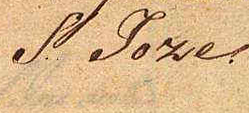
S. Ioze
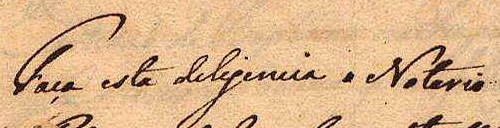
Faça esta diligencia o Notario
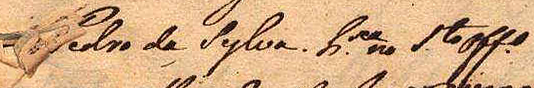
Pedro da Sylva. L.xa no S.to off.o
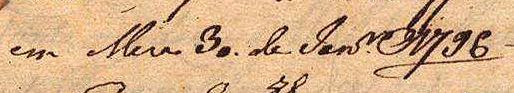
em Meza 30. de Ian.ro d̄ 1796
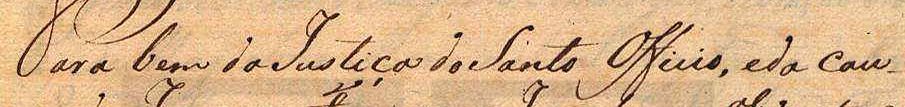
Para bem da Iustiça do Santo Officio, e da cau
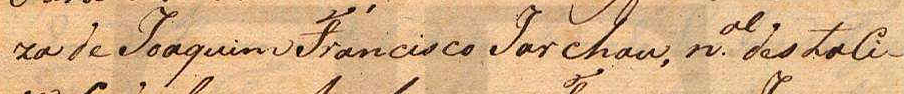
za de Ioaquim Francisco Iarchau, n.al desta Ci
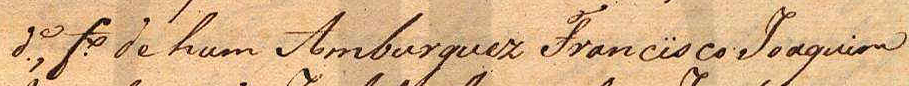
d.e, f.o de hum Amburquez Francisco Ioaquim
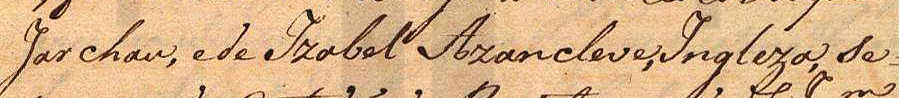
Jarchau, e de Izabel Azancleve, Ingleza, se
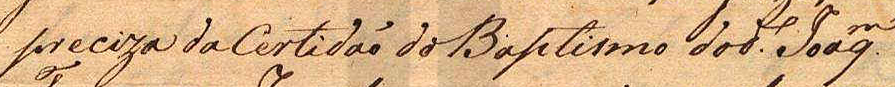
preciza da Certidaõ do Baptismo do d.o Ioaq.m
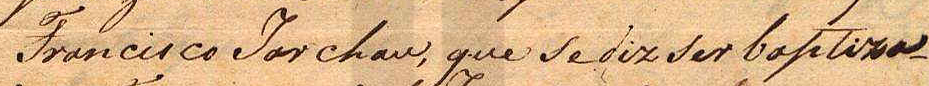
Francisco Iarchau, que se diz ser baptiza
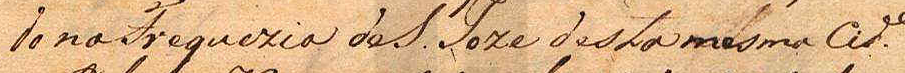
do na Freguezia de S. Ioze desta mesma Cid.e
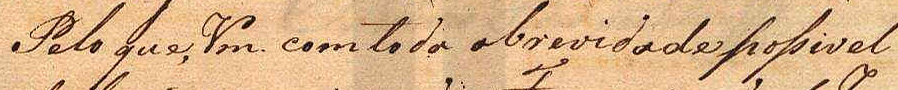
Pelo que, Vm. com toda a brevidade possivel
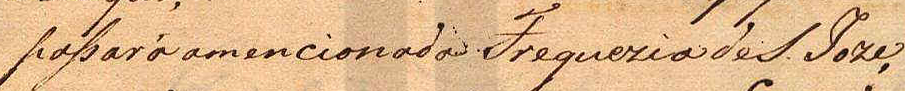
passará a mencionada Freguezia de S. Ioze,
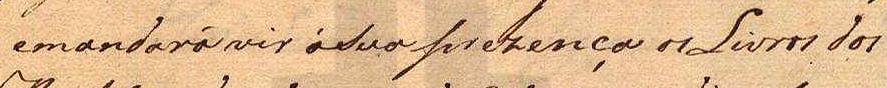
e mandará vir á sua prezença os Livros dos
